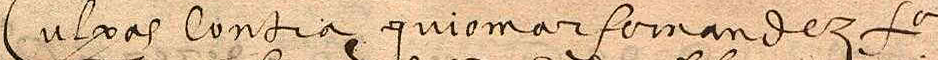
Culpas contra guiomar fernandez fa
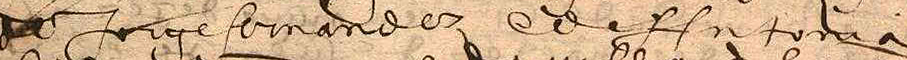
de Jorge fernandez e de Antonia
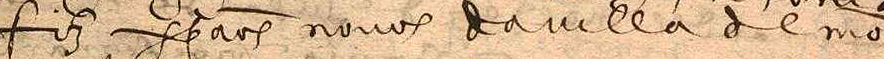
frz̅ xpãos nouos da uilla de mo̅
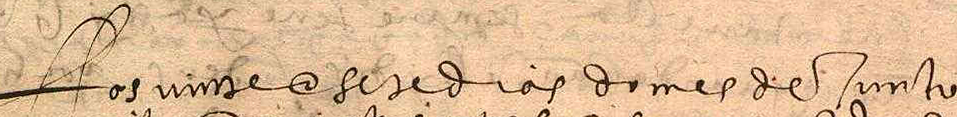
Aos uinte e sete dias do mes de Junho
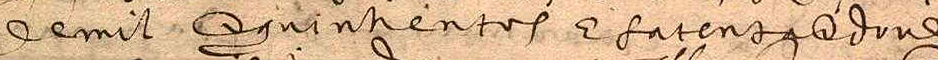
de mil e quinhentos E satenta e dous
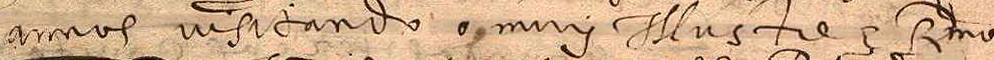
annos uisitando o muy Jllustre e R̅mo
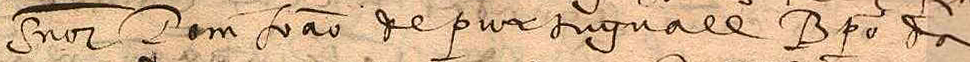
S̅nor Dom João de purtuguall Bp̅o da
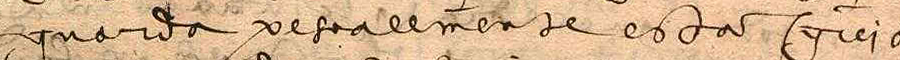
guarda pesoallmente esta Jgreja
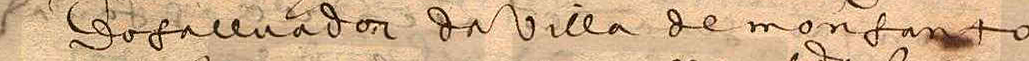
do salluador da Villa de monsanto
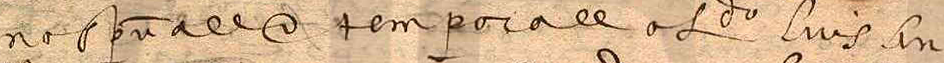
na sp̅uall e temporall o Ldo Luis an
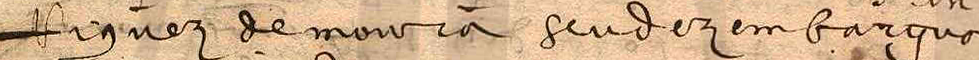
Riquez de moura seu dezembargua
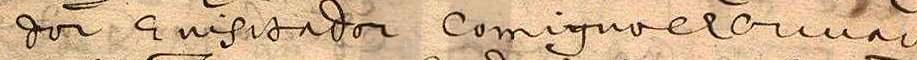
dor E uisitador comiguo escriuaõ
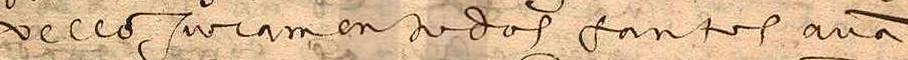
pello Juramento dos santos au̅a
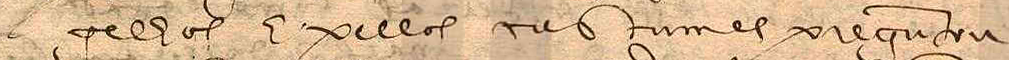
gelhos E pellos custumes preg̅utou
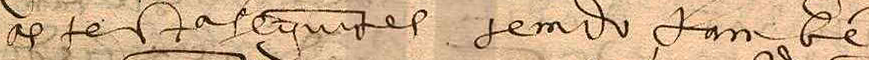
as testa seg̅uites semdo tambe̅
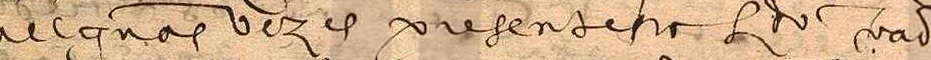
allgu̅as vezes presente ho Ldo João
